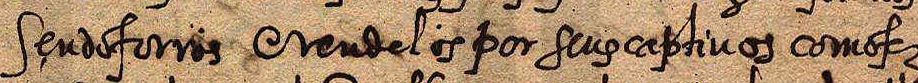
sendo forros e vendelos por seus captiuos como fez
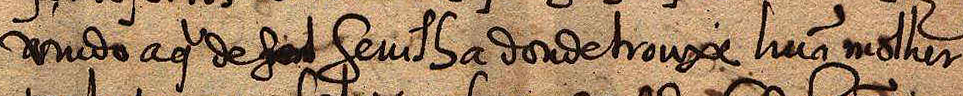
vindo aqi de _ seuilha donde trouxe huā molher
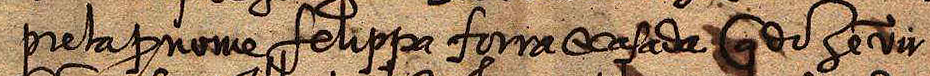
preta ꝑ nome felippa forra e casada q̄ dizē vir
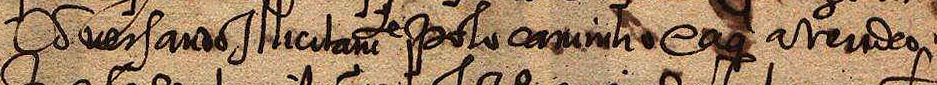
Cōuersando Jllicitamte polo caminho e aq̄ a vendeo
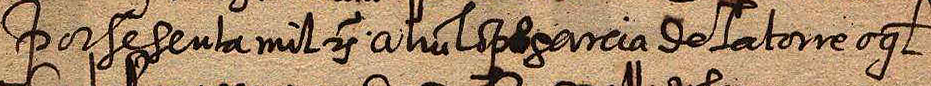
por sesenta mil r̄s a hū lopo garcia de la torre o q̄l
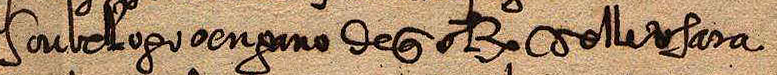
Soube logo o engano de q̄ o Rꝭ cō elle vsara
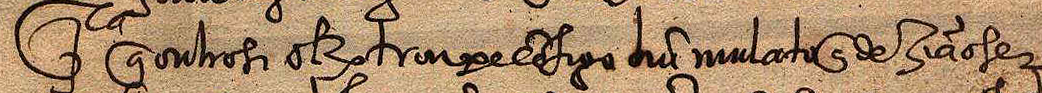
p̄ra q̄ outrosi o Rꝭ trouxe cōsigo hū mulato q̄ dezião ser
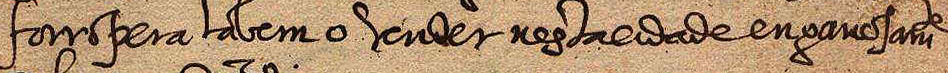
forro pera tābem o vender nesta cidade enganosamte
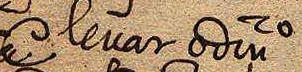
e leuar o dinro
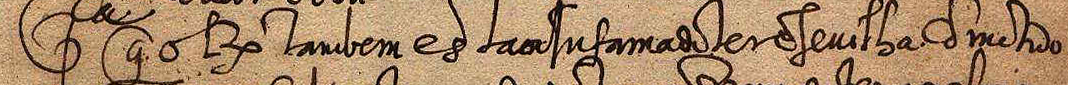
p̄ra q̄ o Rꝭ tambem estaa Jnfamado ter ē seuilha cōmetido
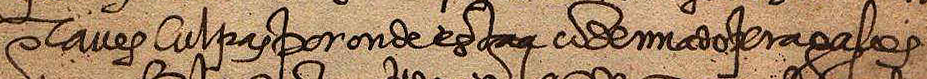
graues Culpas por onde estaa cōdennado pera gales
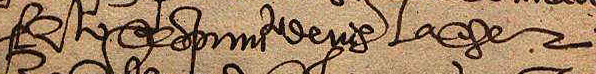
Rto e cōprimto de iusta e ser
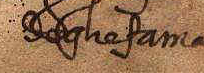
do q̄ he fama
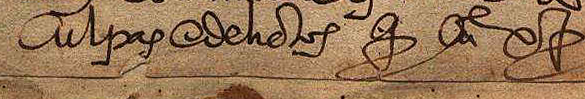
Culpas e delictos ꝗ cū xꝓ
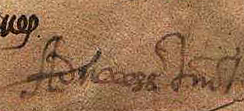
Ad necess Iust
